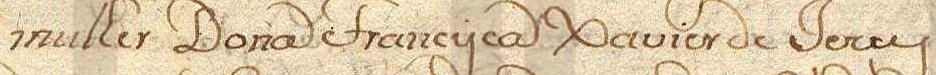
mulher Dona Francisca Xavier de Iezus
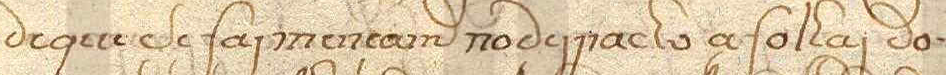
de que se faz mençam no despacho a folhas do
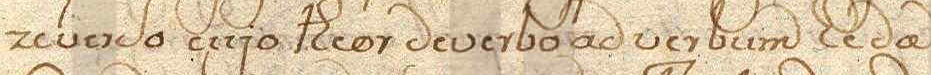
ze verso cujo Theor de verbo ad verbum he da
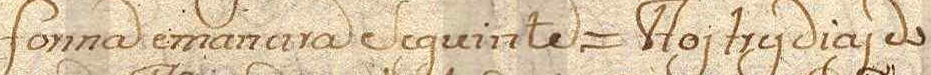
forma e maneira seguinte= Aos tres dias do
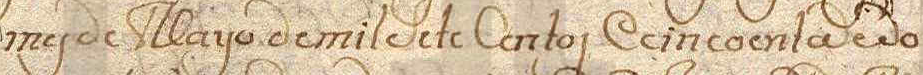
mes de Mayo de mil SeteCentos e cincoenta e do
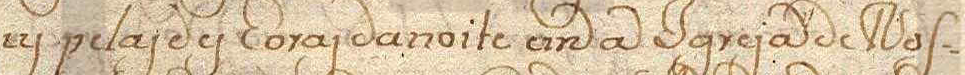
us pelas des horas da noite em a Igreja de Nos
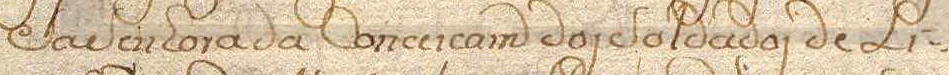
sa Senhora da Conceiçam dos Soldados de Li
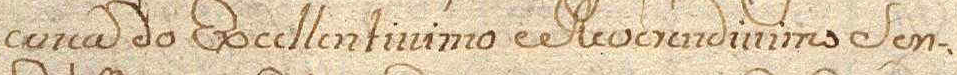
cença do Excellentissimo e Reverendissimo Sen
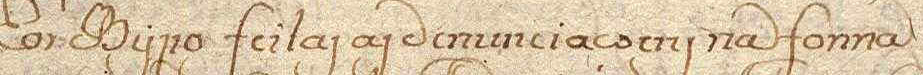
hor Bispo feitas as denunciaçoens na forma
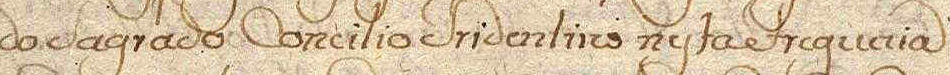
do Sagrado Concilio Tridentino nesta Freguezia
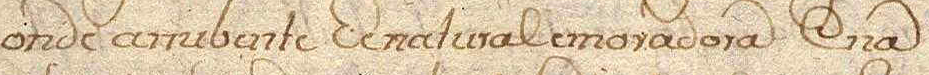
onde a nubente he natural e moradora e na
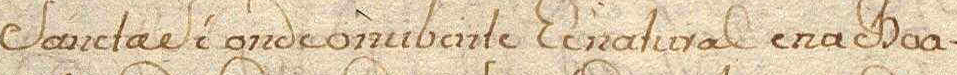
Sancta Sé onde o nubente he natural e na Boa
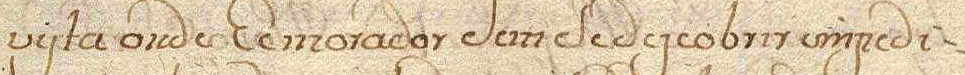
vista onde he morador Sem se descobrir impedi
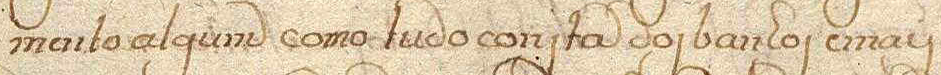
mento algum como tudo consta dos banhos e mais
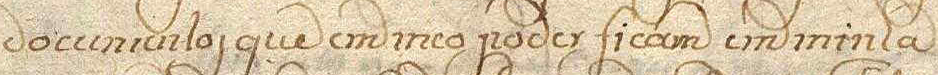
documentos que em meo poder ficam em minha
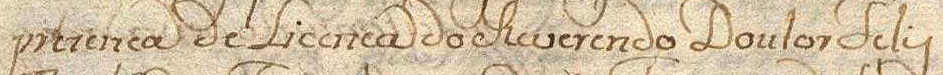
prezença de Licença do Reverendo Doutor Felis
